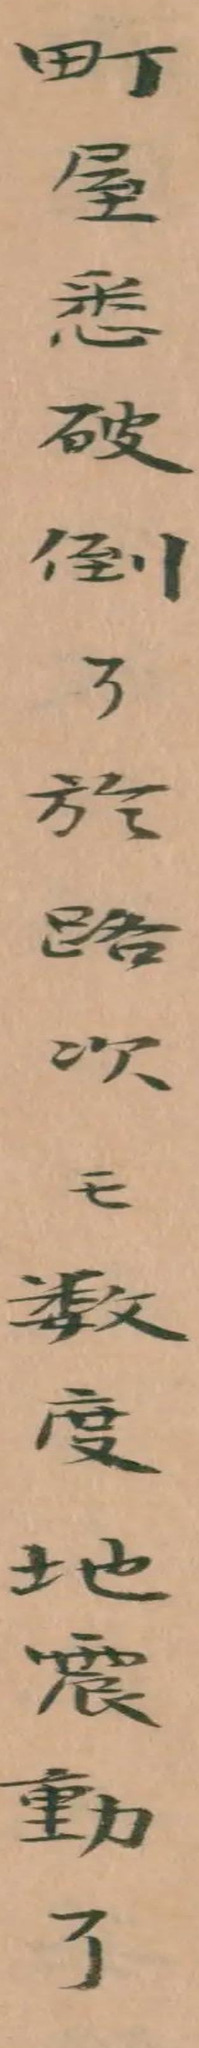町屋悉破倒了於路次モ数度地震動了
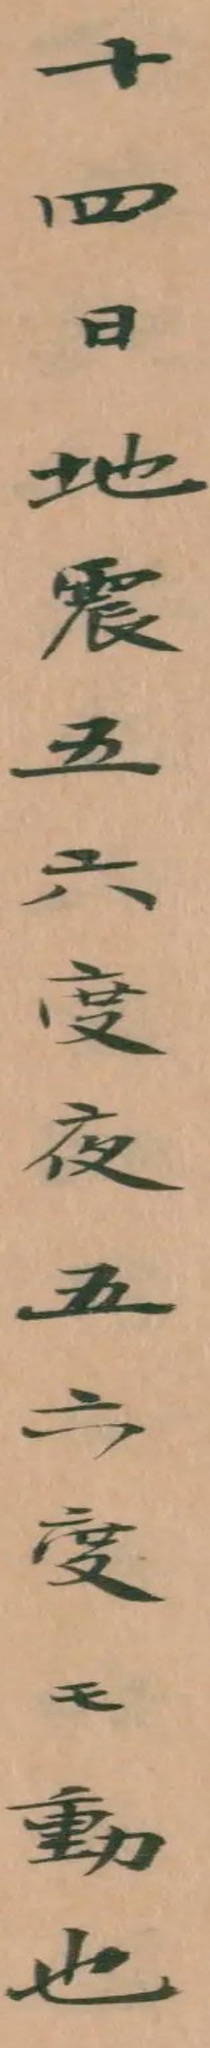十四日地震五六度夜五六度モ動也
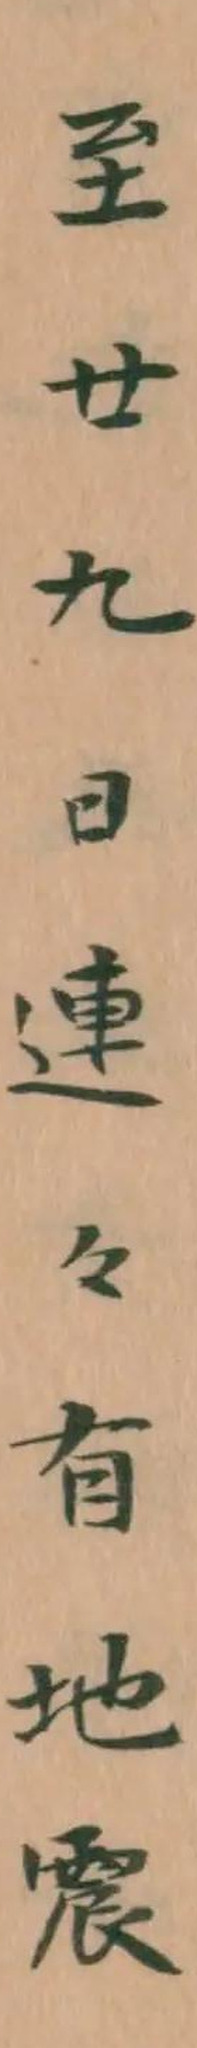至廿九日連々有地震
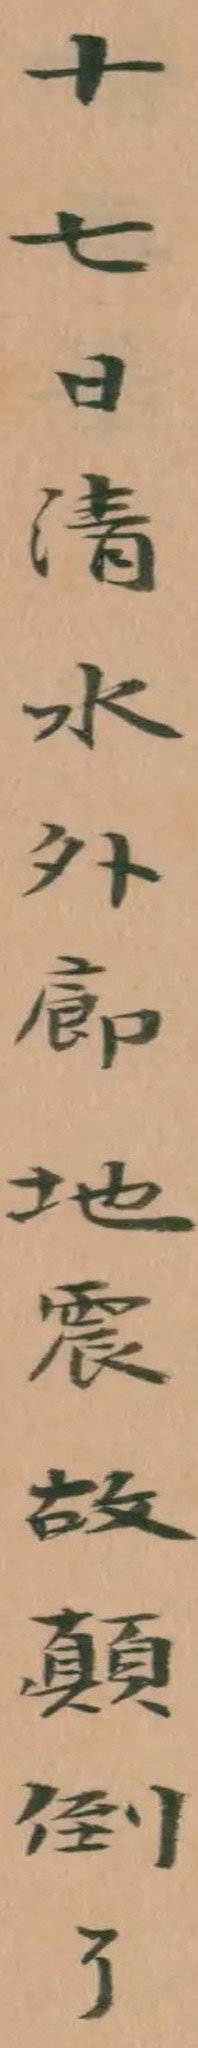十七日清水外廊地震故顛倒了
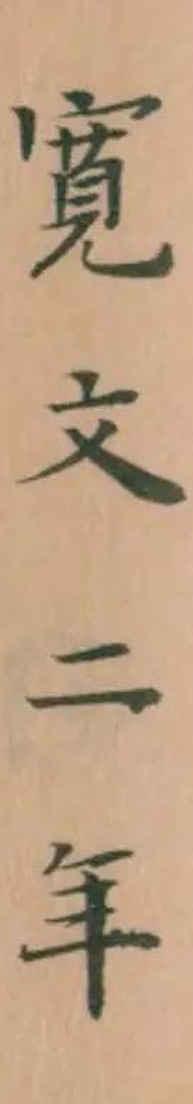寛文二年
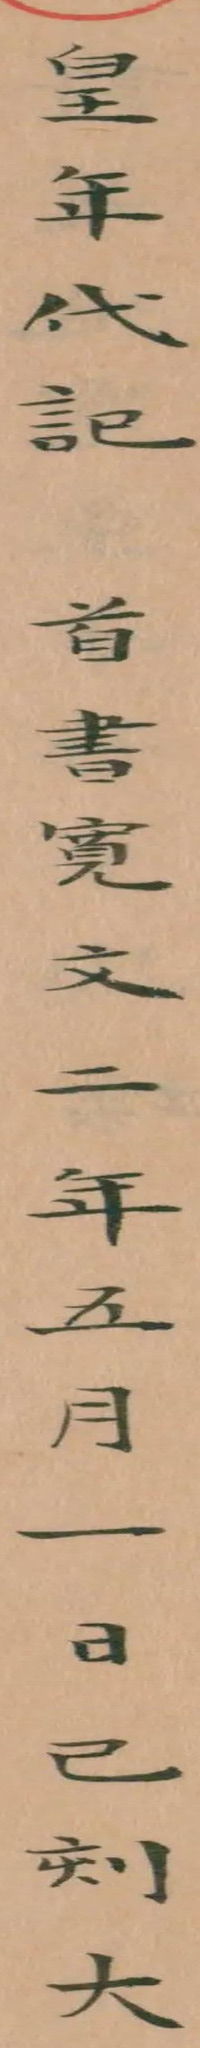○皇年代記首書寛文二年五月一日巳刻大
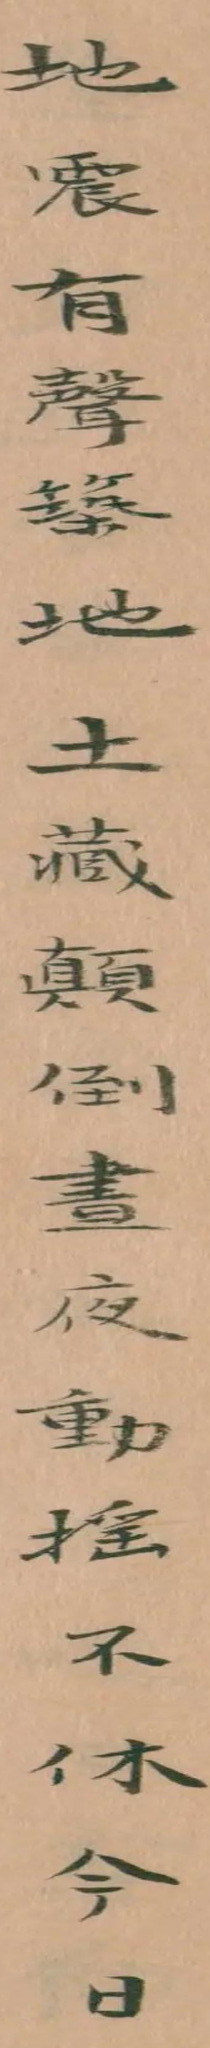地震有声築地土蔵顛倒昼夜動揺不休今日
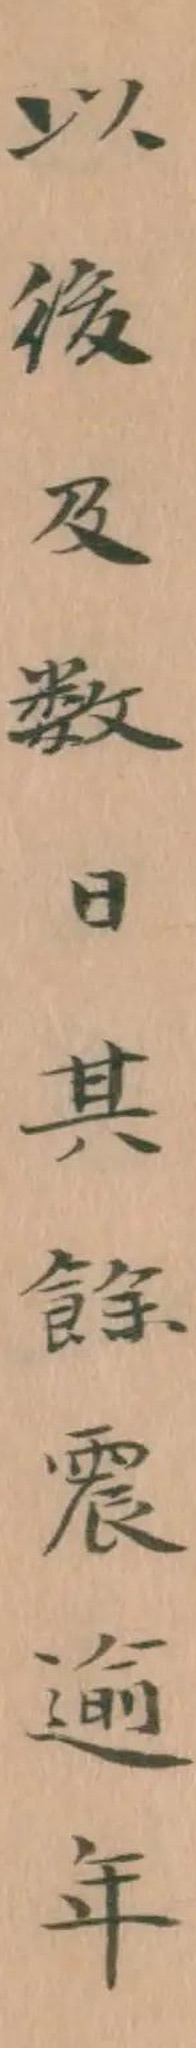以後及数日其余震逾年
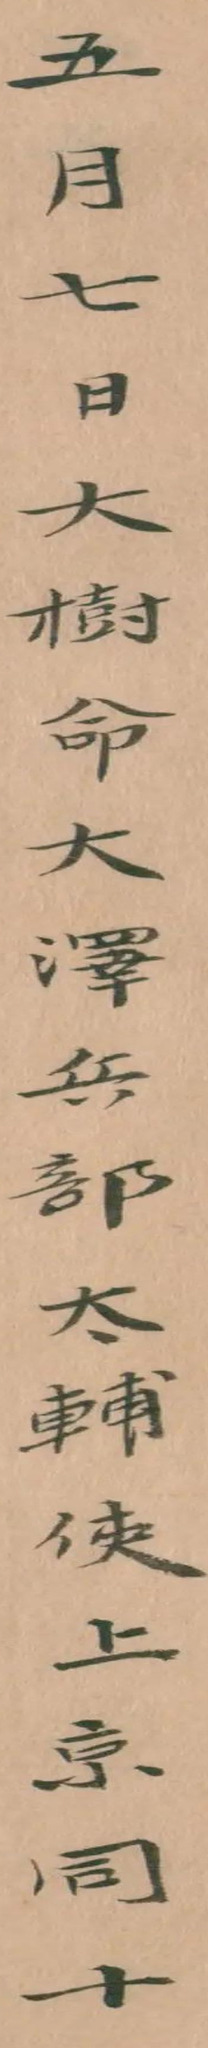五月七日大樹命大沢兵部太輔使上京同十
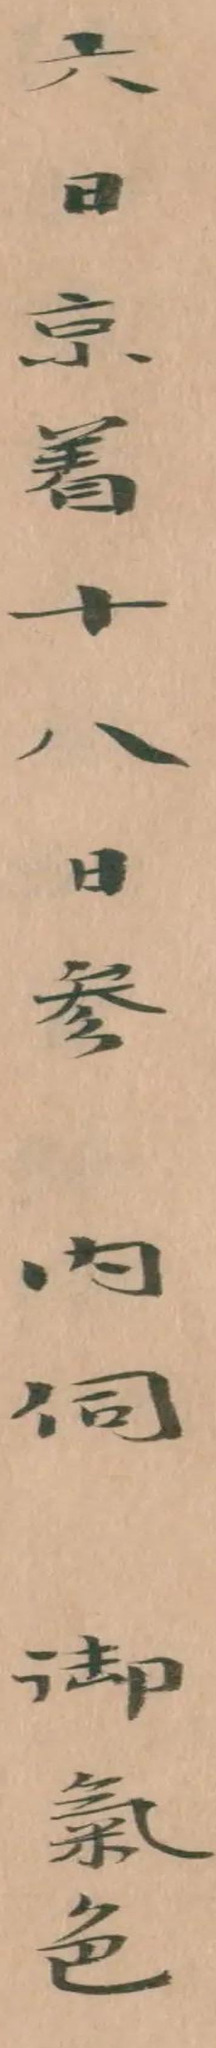六日京着十八日参内伺御気色
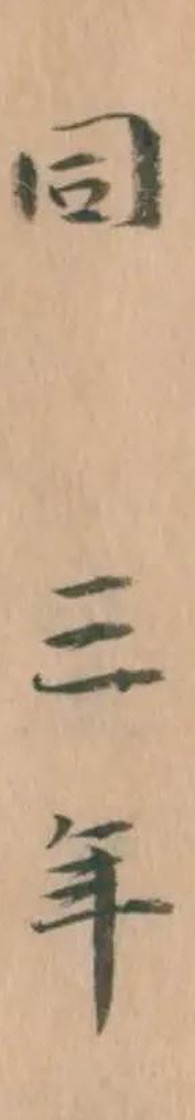同三年

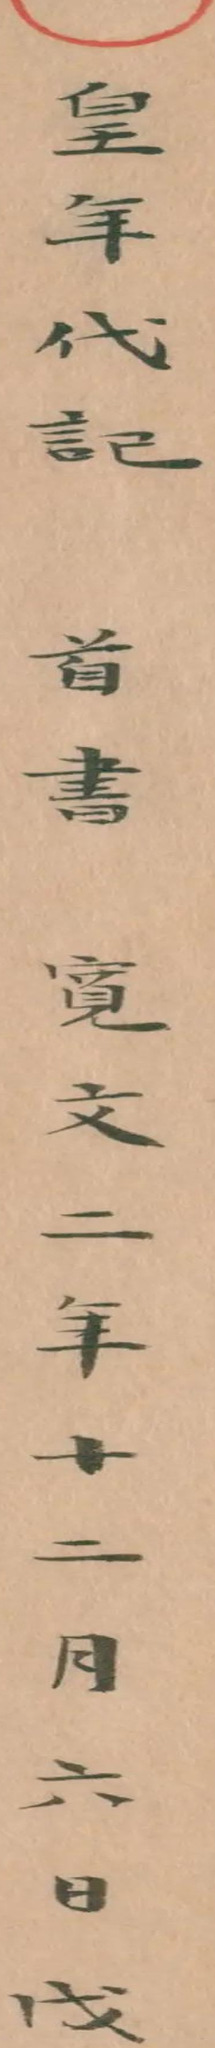○皇年代記首書寛文二年十二月六日戊
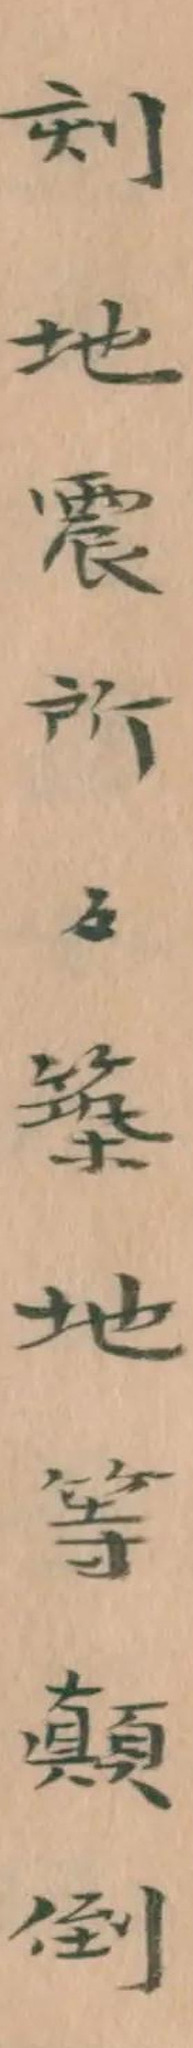刻地震所々築地等顛倒
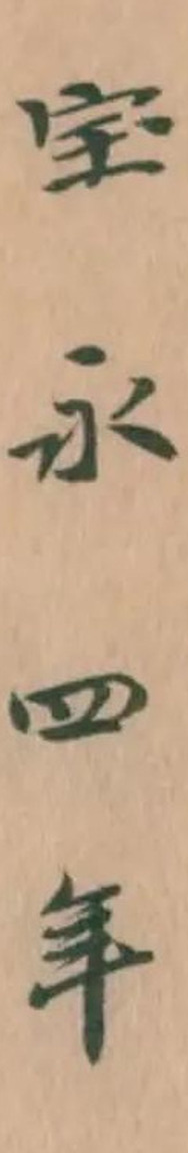宝永四年
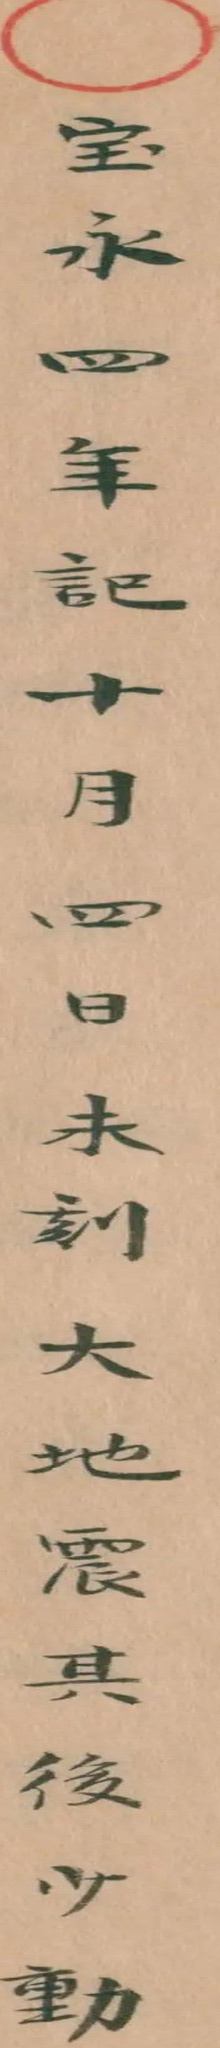○宝永四年記十月四日未刻大地震其後少動
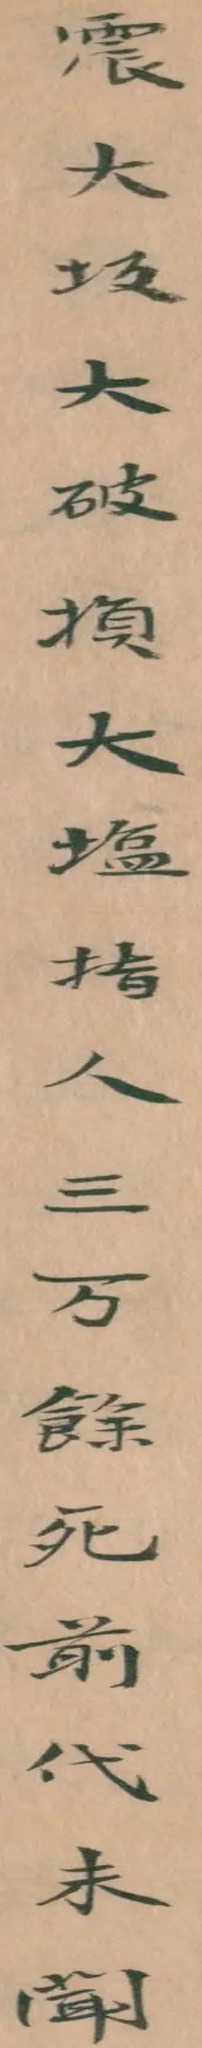震大坂大破損大塩指人三万余死前代未聞
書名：地災撮要. 巻5-6(地震之部)
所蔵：国立国会図書館 National Diet Library, JAPAN
